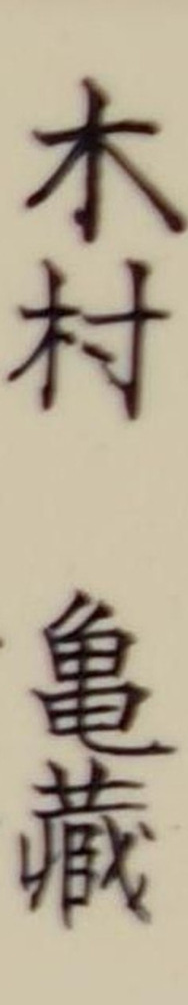木村亀蔵
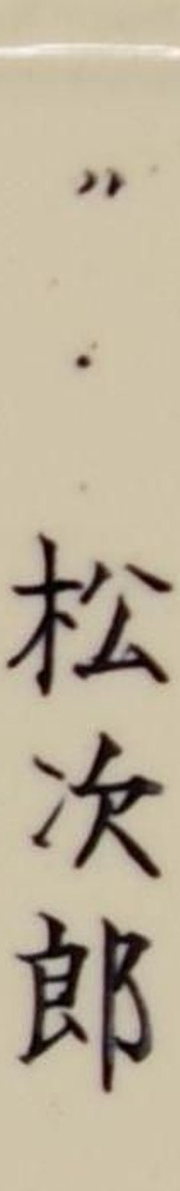松次郎
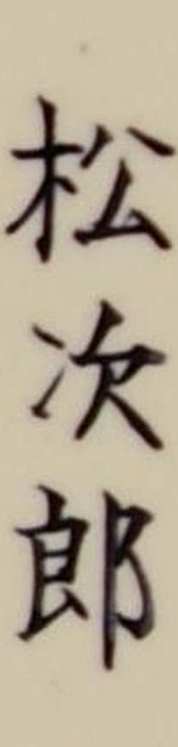松次郎
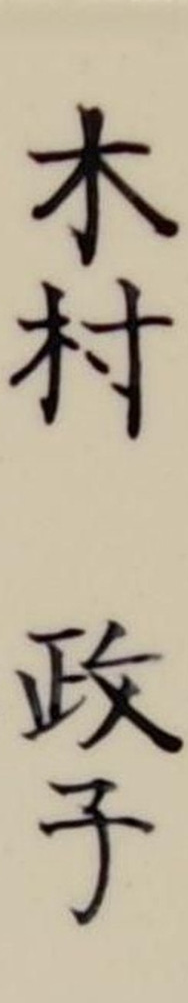木村政子
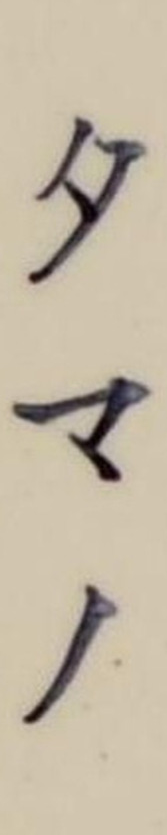タマノ
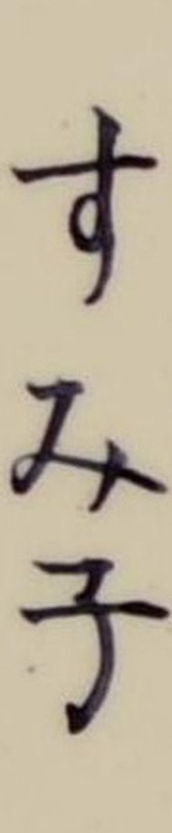すみ子
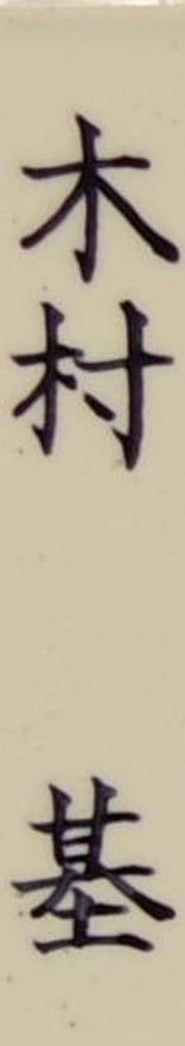木村基
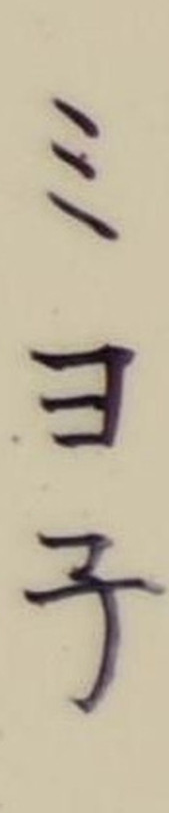ミヨ子

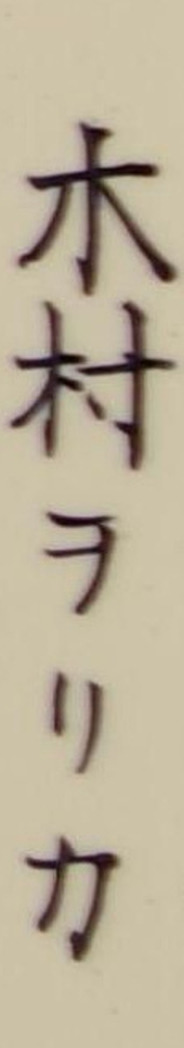木村ヲリカ
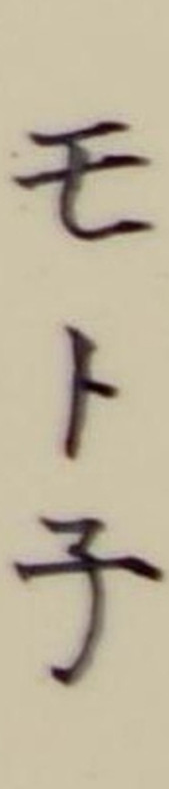モト子
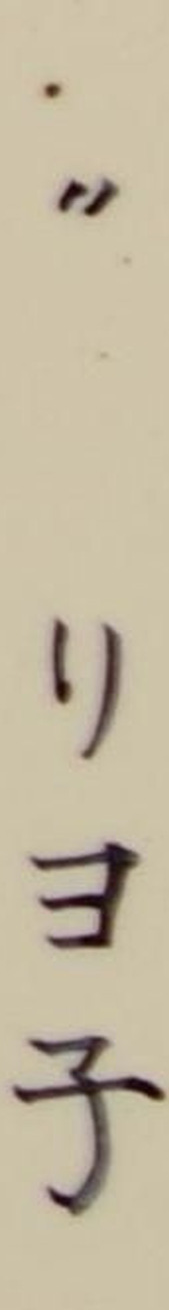リヨ子
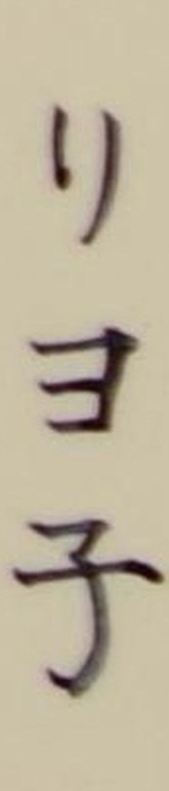リヨ子
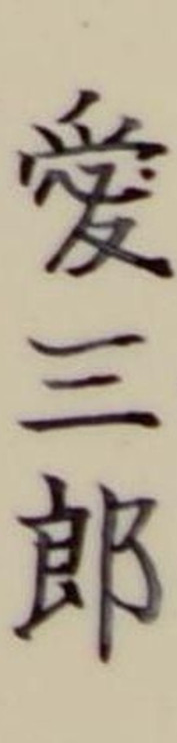愛三郎
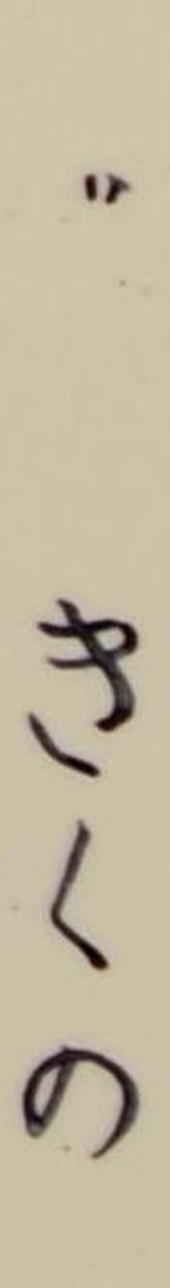きくの
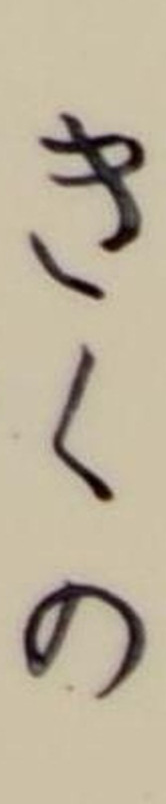きくの

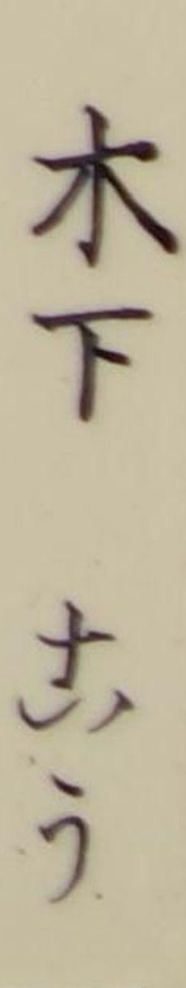木下こう
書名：E~L
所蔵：高野山金剛峯寺
